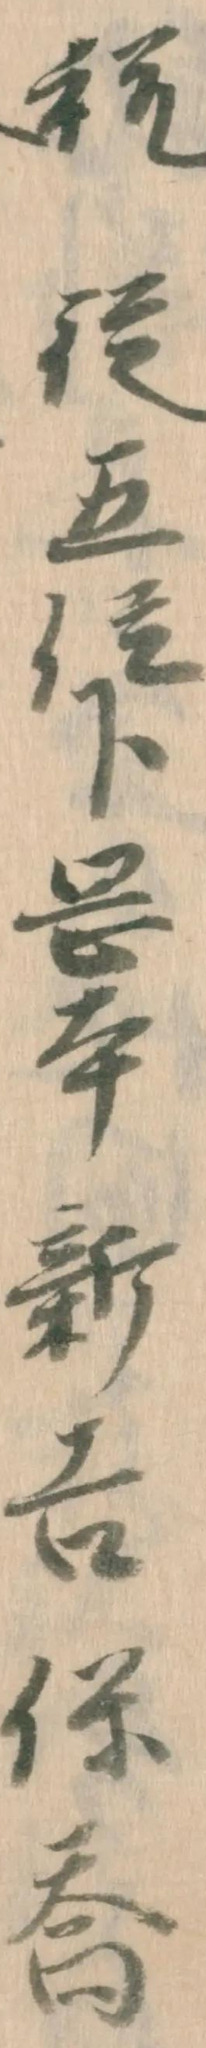祝従五位下岡本新吉保喬
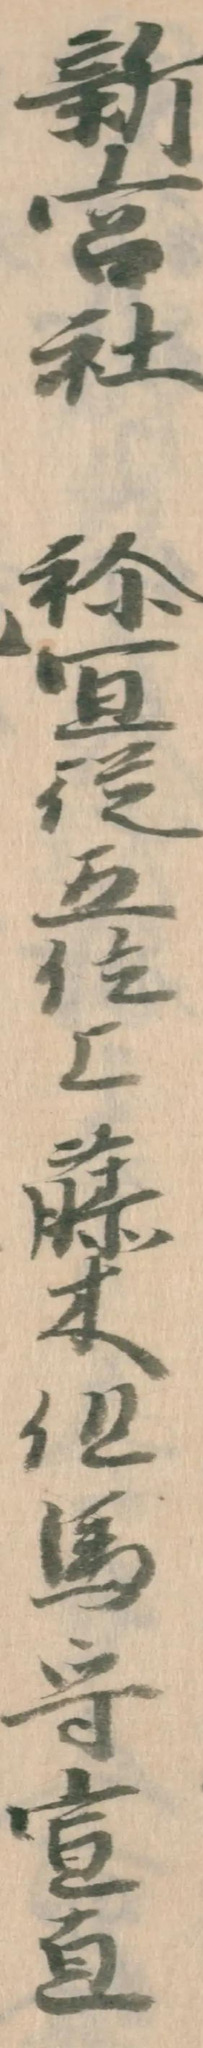新宮社祢宜従五位上藤木但馬守宣直
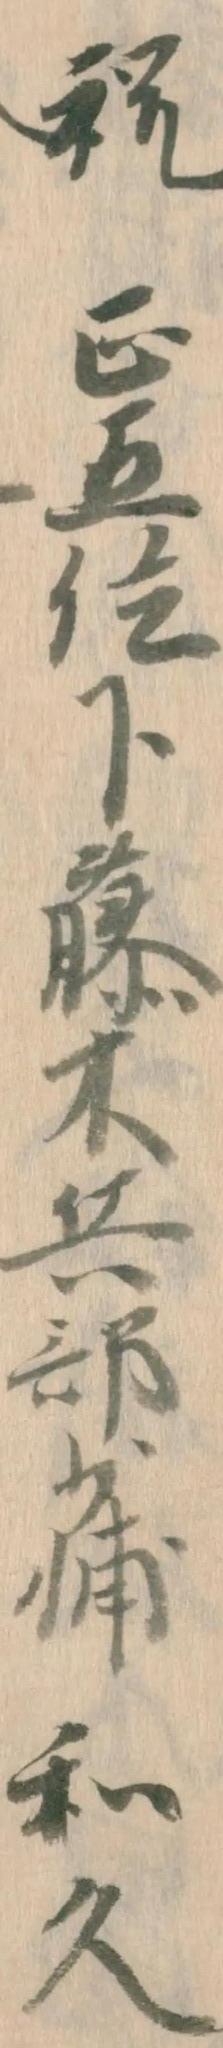祝正五位下藤木兵部少輔和久
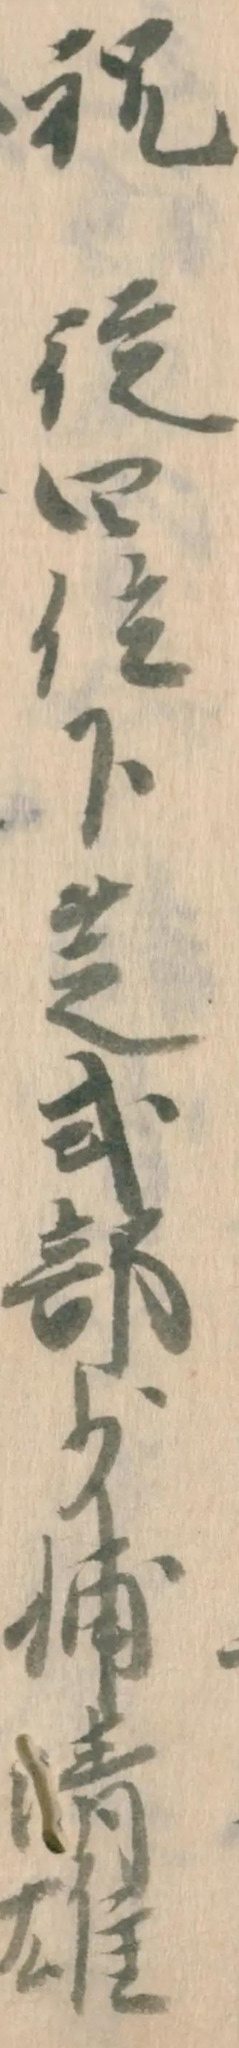祝従四位下芝式部少輔清雄
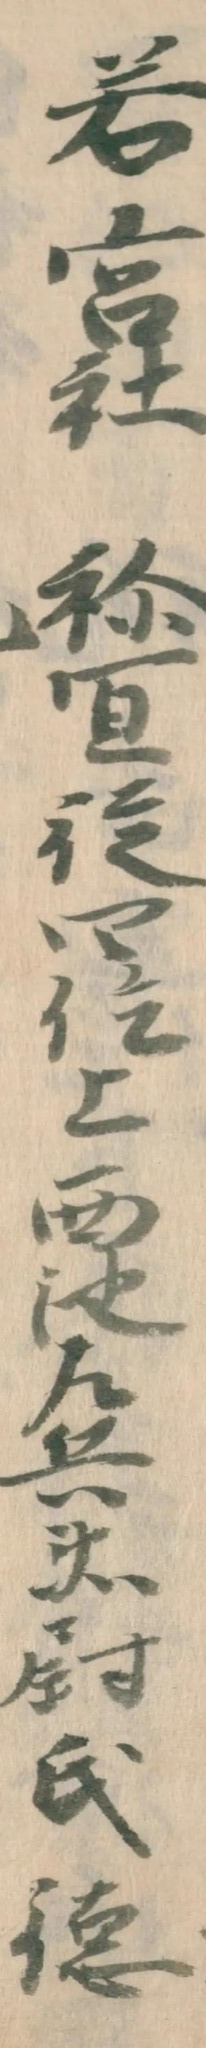若宮社祢宜従四位上西池左兵衛尉氏徳
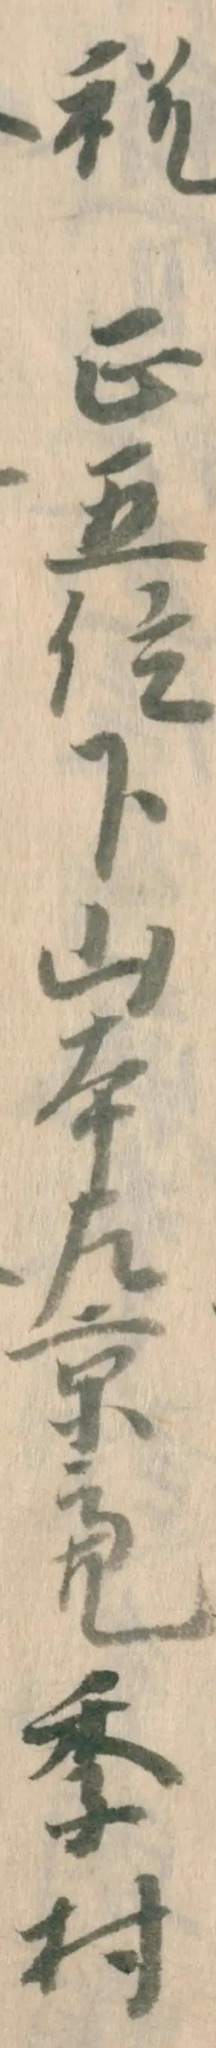祝正五位下山本左京亮季村
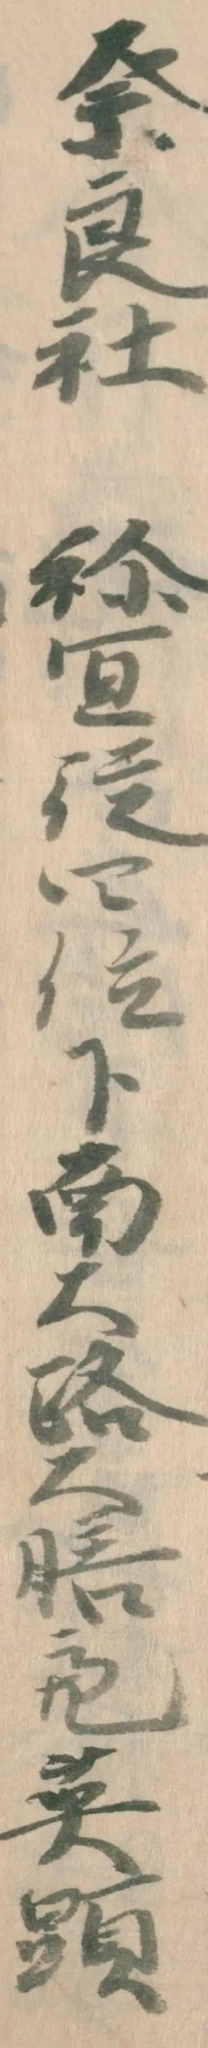奈良社称宜従四位下南大路大膳亮英顕
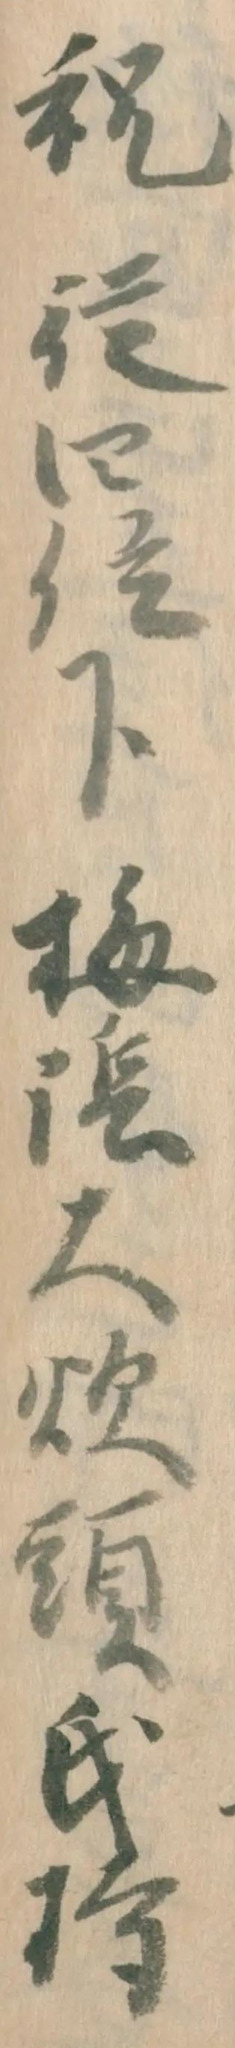祝従四位下梅陰大炊頭氏持

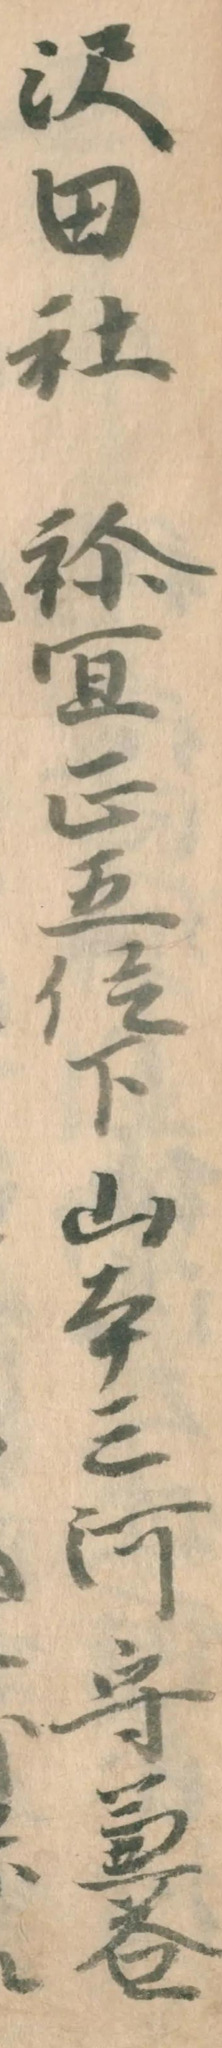沢田社祢宜正五位下山本三河守兼益
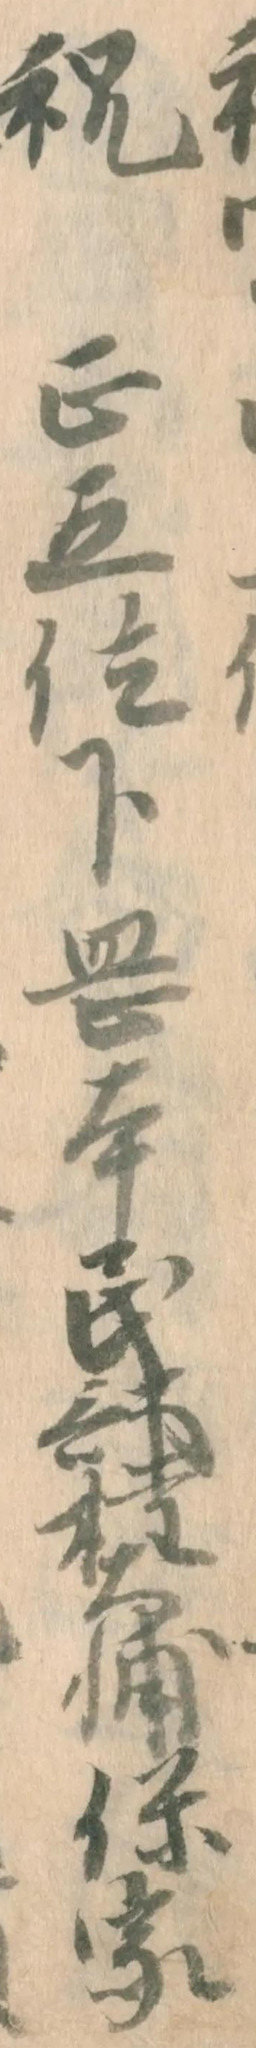祝正五位下岡本民部権大輔保家
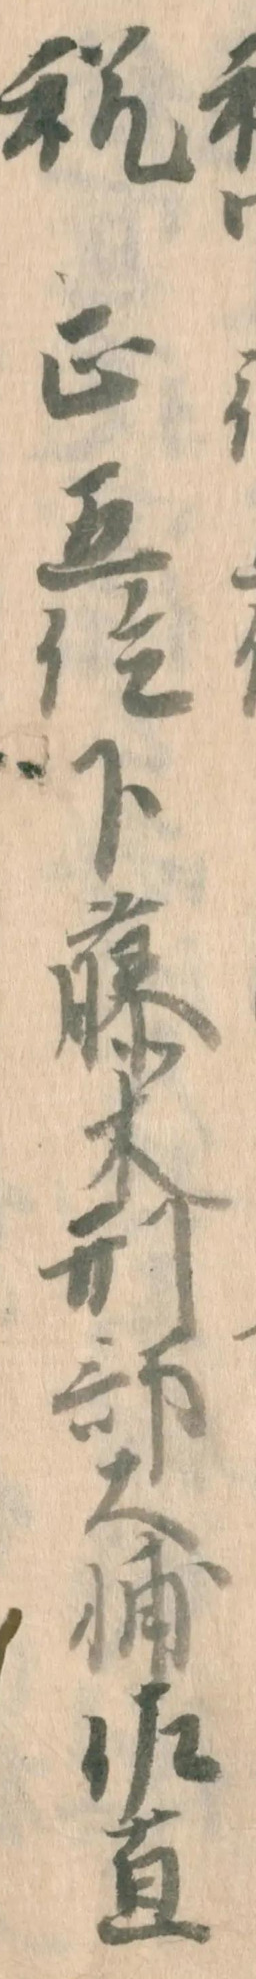祝正五位下藤木刑部大輔佐直
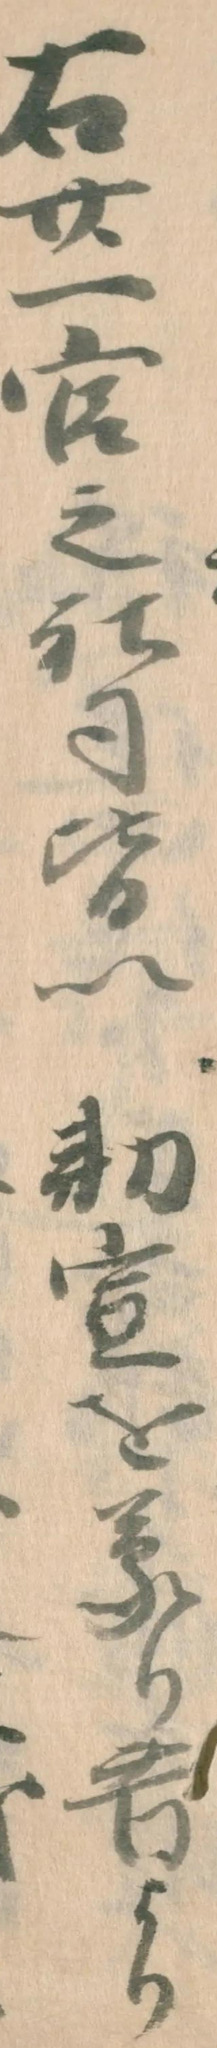右廿一官之社司皆以勅宣を蒙り昔より
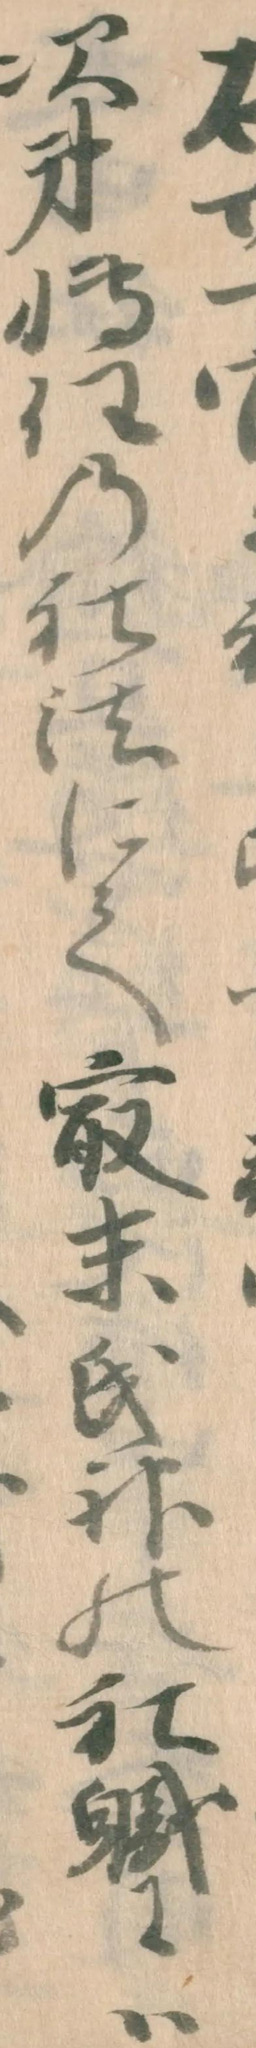次第転任の社法にて最末氏神の社職には
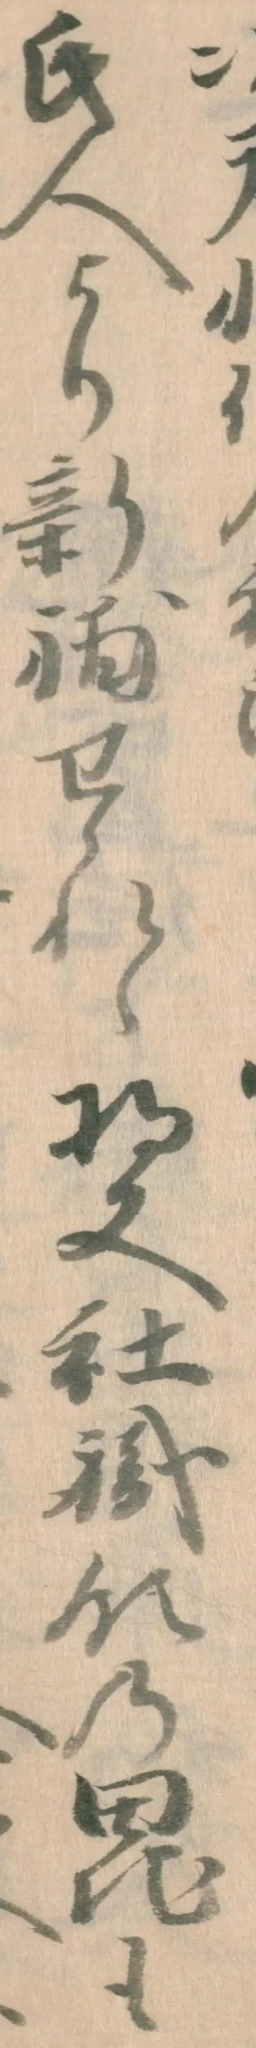氏人より新補せられ候将又社職領の田地も
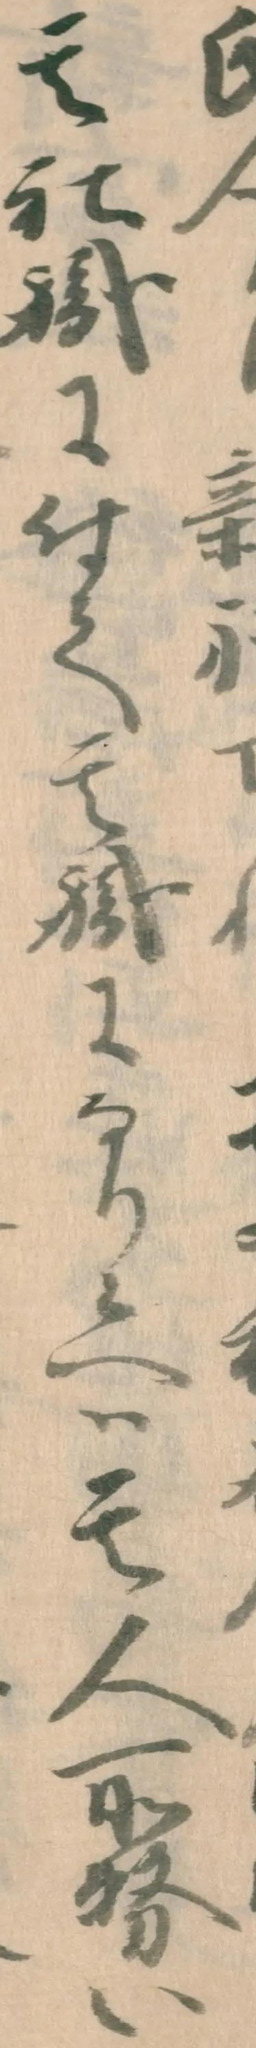其社職に付て其職になり候へは其人所務い
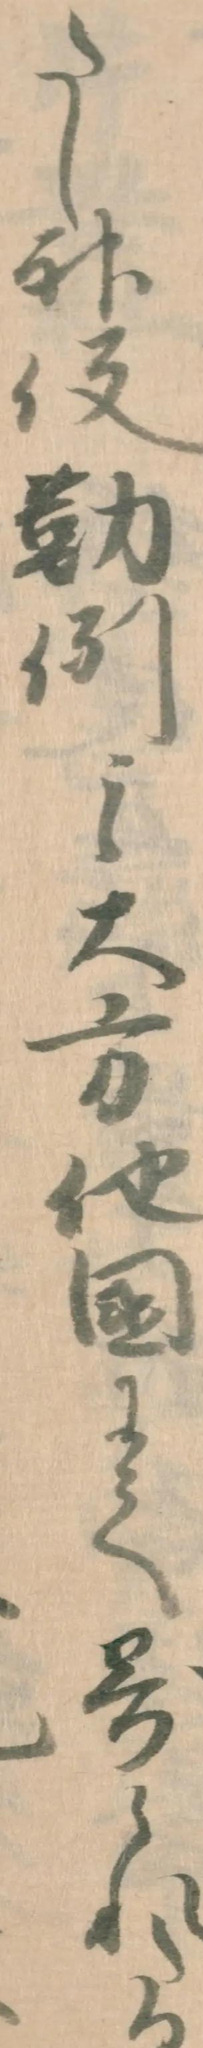たし神役勤例ニ候大方他国にて寄られたる
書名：賀茂社記録. 第1冊
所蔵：国立国会図書館 National Diet Library, JAPAN
